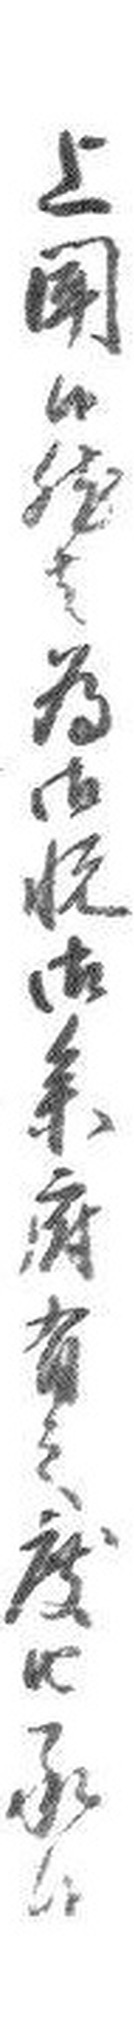上聞候然者為御悦御参府有之度由承候
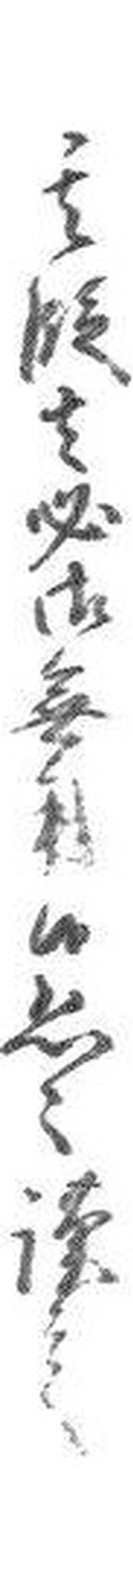其段者必御無用候恐々謹言
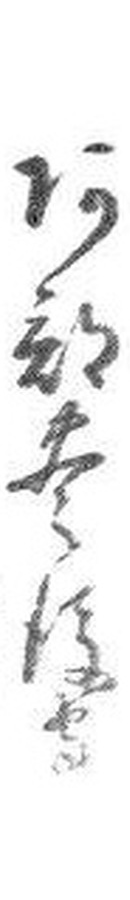阿部豊後守
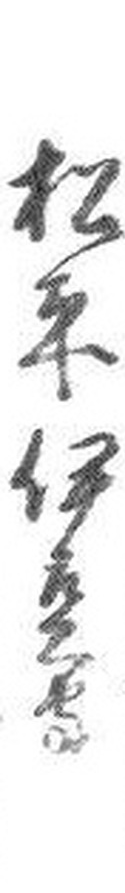松平伊豆守
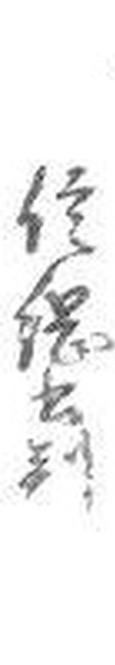信綱書判
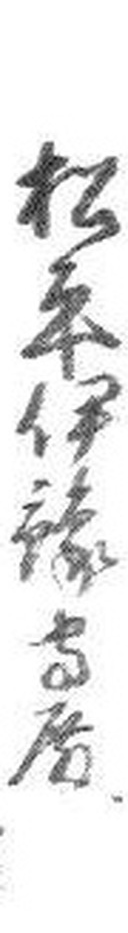松平伊予守殿
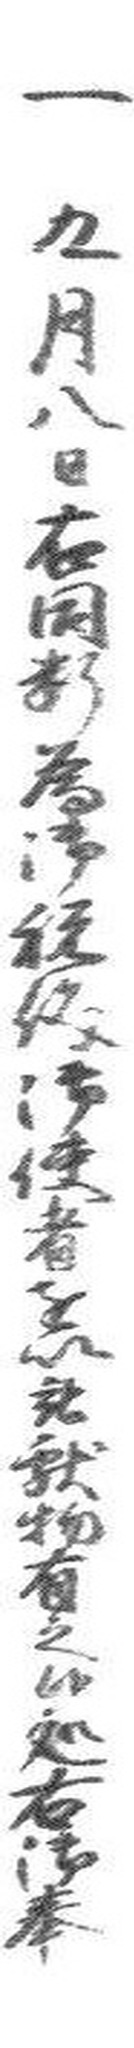一九月八日右同断為御祝儀御使者を以献物有之候処右御奉
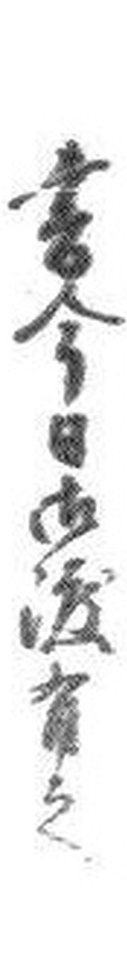書今日御渡有之

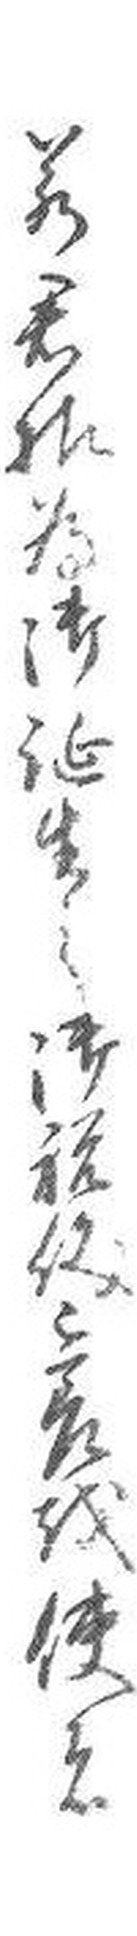若君様為御誕生之御祝儀被差越使者
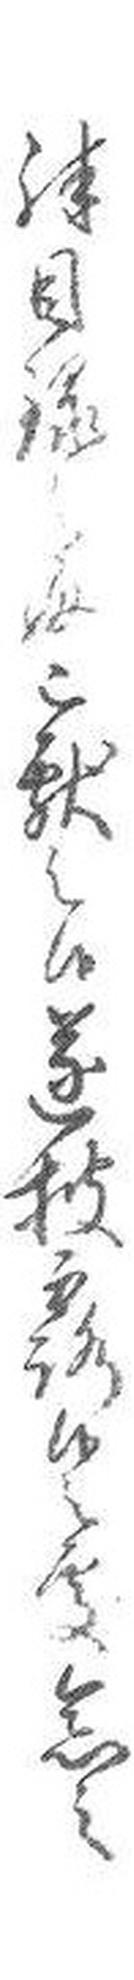殊目録之通被献之候遂披露候之処念之
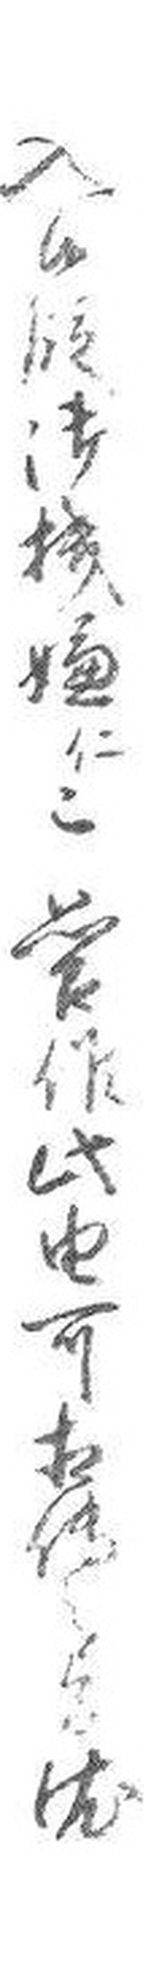入候段御機嫌仁被思召候此由可相伝之旨依
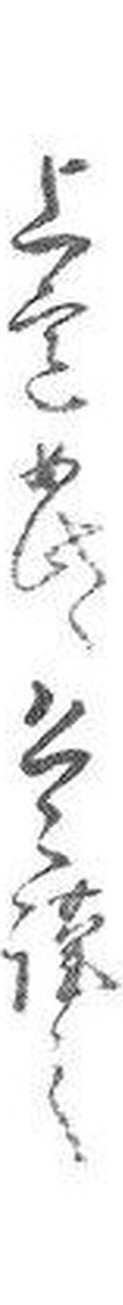上意如此候恐々謹言
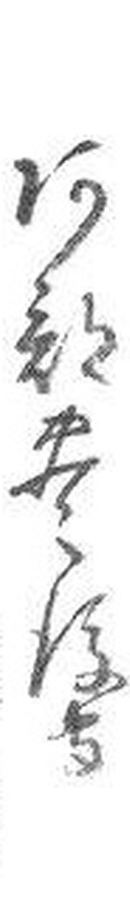阿部豊後守
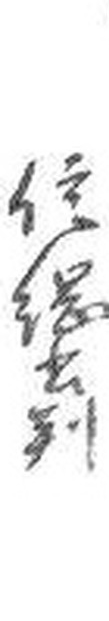信綱書判
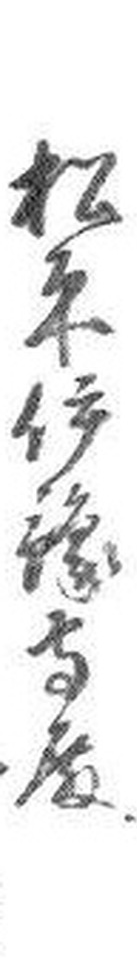松平伊予守殿
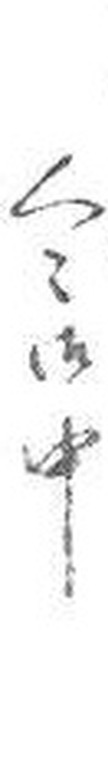人々御中
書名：家譜 四 忠昌公 従寛永七年到正保四年
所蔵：福井県文書館 Fukui Prefectural Archives
